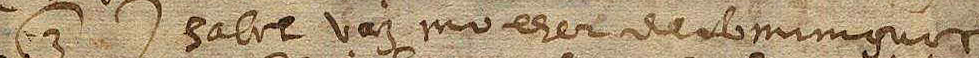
item Jsabel vaz molher de dominguos
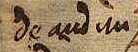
de auditu
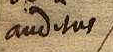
auditus
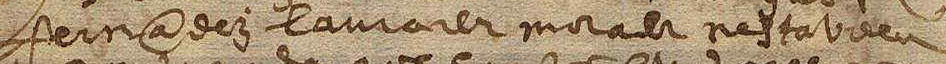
fernādez laurador morador nesta villa
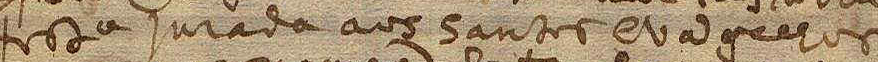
testa jurada aos santos evāgelhos
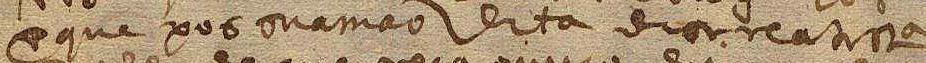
ē que pos sua maõ drta dise ela testa
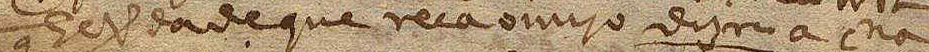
q̄ he ꝟdade que ella ouujo diser a cna
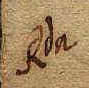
Rda
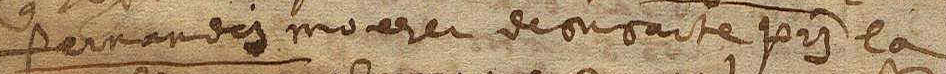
fernandez molher de susarte piz̄ la
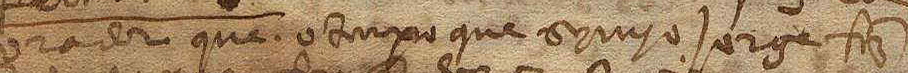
vrador que o tenpo que syrujo Jorge frz̄
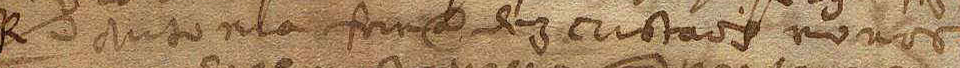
e antonia fernādez cristaos nouos
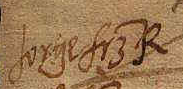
Jorge frz̄ R
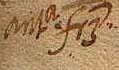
anta frz̄.
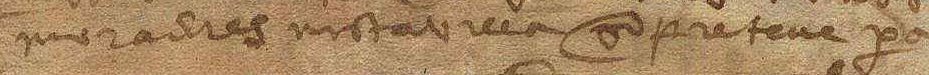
moradores nesta villa sēpre teue ꝑa
